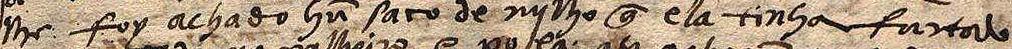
lhe foy achado hū saco de mjlho q̄ ela tinha furtado
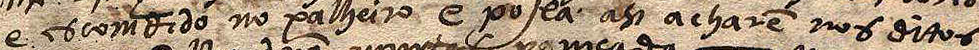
e escomdido no palheiro e po la asi acharē nos ditos
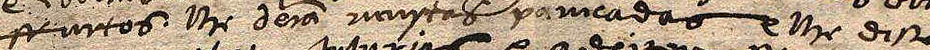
ffurtos lhe der̄a muytas pamcadas e lhe dise
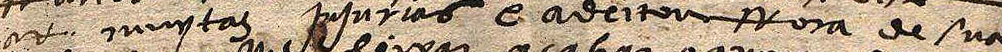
a R muytas Jnjurias e a deitou ffora de sua
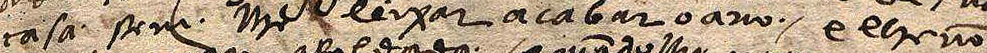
casa sem lhe leixar acabar o ano. e lhe nō
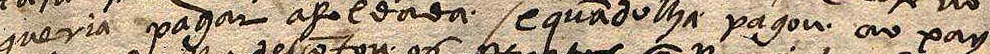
queria pagar a soldada / e quādo lha pagou ao pay
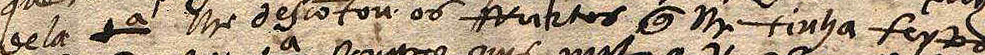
dela ta lhe descōtou os ffurtos q̄ lhe tinha feytos
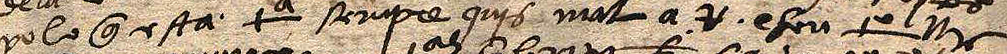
polo q̄ esta ta sempre qujs maL a R e seu to lhe
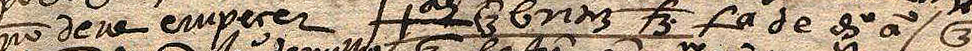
nō deue empeçer tas item britez f̄z filha de dio ao / item
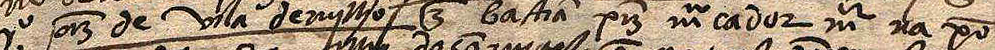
yo p̄iz de vila de mjlho / item bastiā pīz m̄cador mor na pō
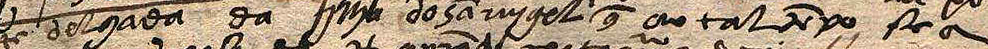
te delgada da Jlha de Sā mjgeL q̄ ao taL tēpo se a
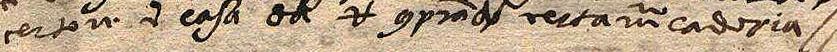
certou ē casa da R ꝯprādo certa m̄cadoria //
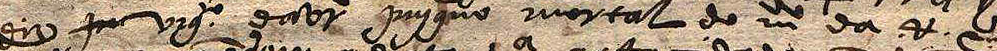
diz Jm vig.ro davro Jmjguo mortaL do mdo da R e
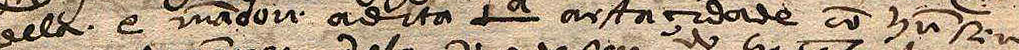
dela e mādou a dita ta a esta çidade c̄o hū seu
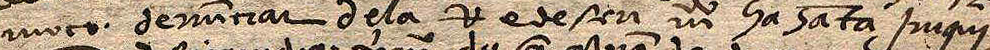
moço denūciar dela R e de seu mdo ha Sāta Jmquj
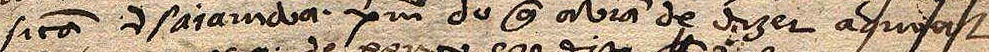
siçā ēsaiamdoa pimo do q̄ aviā de dizer a quoaL
